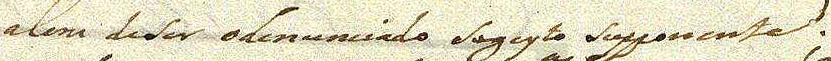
alem de ser o denunciado sogeyto supponente;
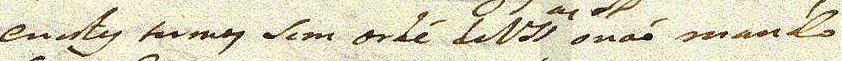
e nestes termos sem ordé de V SSas, o naõ mando
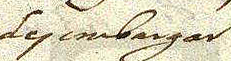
desembargar
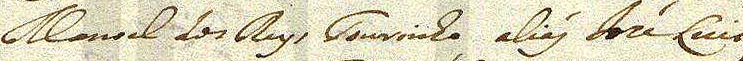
Manoel dos Reys Tourinho, aliás Iozé Luis,
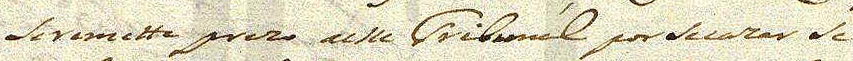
seremette prezo a esse Tribunal por se cazar se
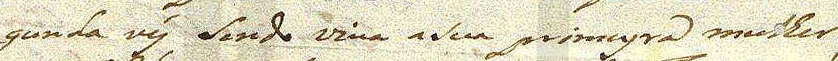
gunda vés, sendo viua a sua primeyra mulher
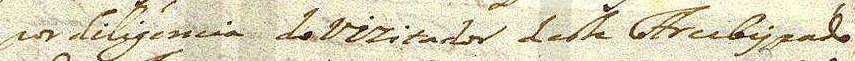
por diligencia do Vizitador deste Arcebispado
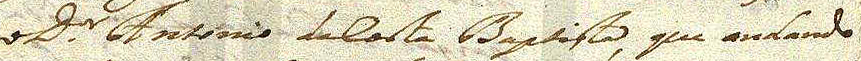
o D.or Antonio da Costa Baptista, que andando
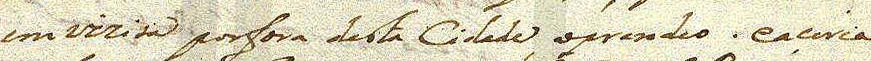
em vizita por fora desta Cidade, o prendeo. e açerca
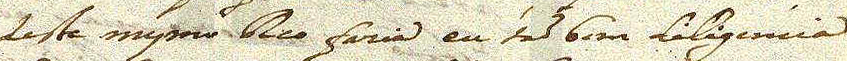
deste mesmo Reo fazia eu taõbem diligencia
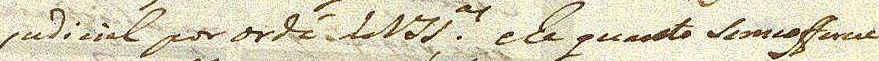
judicial por ordé da V SS.as, e he quanto semeofferece
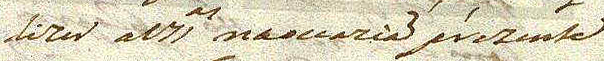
dizer a V SSas na occaziaõ prezente
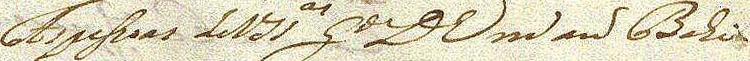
As pessoas de V SSas Gde D Em̄ an̄ Bahia
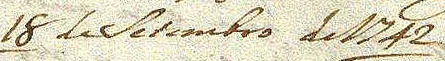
18 de Setembro de 1742
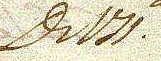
De VSS.as
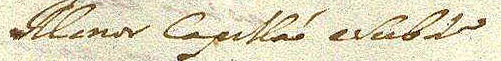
Menor Capellaõ e Subdo
